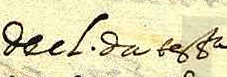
decl. da testa
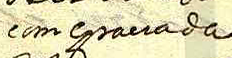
com Gracia da
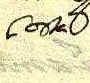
Costa
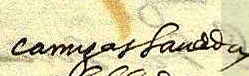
camisas lauadas
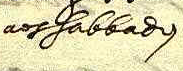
aos sabbados
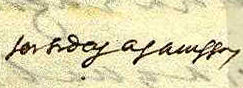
ser todas as auessas
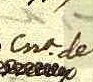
Cn.a de
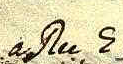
a Ree E
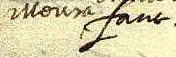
Moura faut
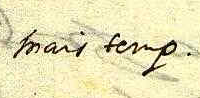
mais temp.
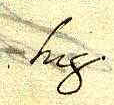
lug.
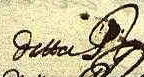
ditta R
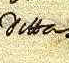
ditta
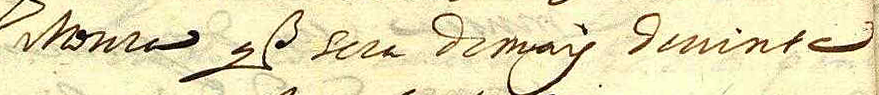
Moura q̄ sera de mais de uinte
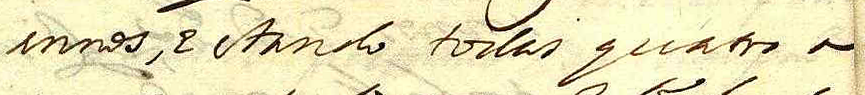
annos, E estando todas quatro a
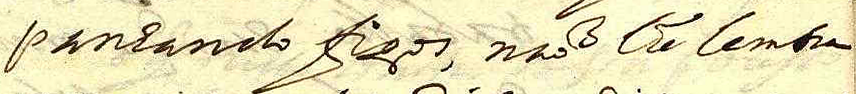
panhando figos naõ lhe lembra
